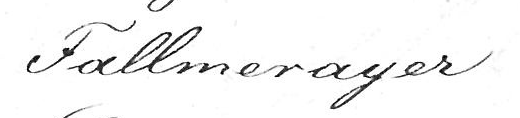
Fallmerayer
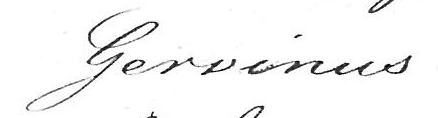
Gervinus
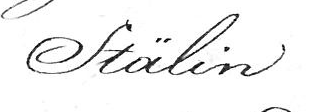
Stälin
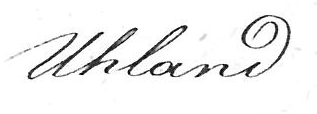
Uhland
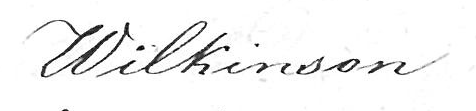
Wilkinson
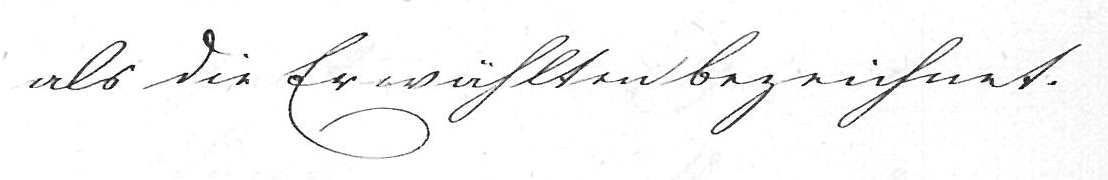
als die Erwählten bezeichnet.
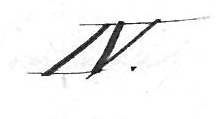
IV.
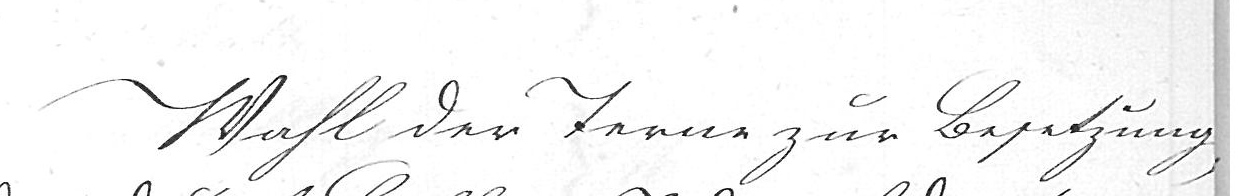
Wahl der Terne zur Besetzung
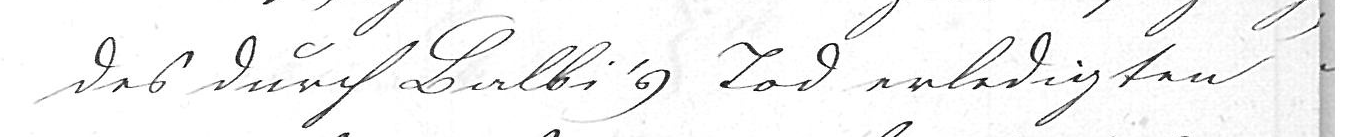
des durch Balbi's Tod erledigten
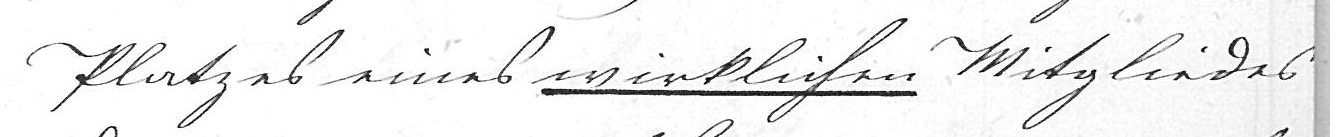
Platzes eines wirklichen Mitgliedes
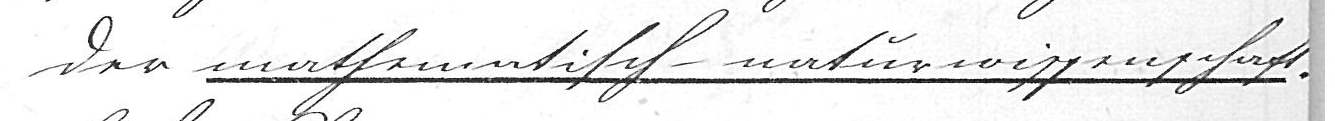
der mathematisch-naturwissenschaft-
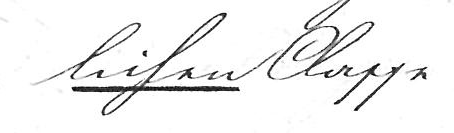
lichen Classe.
